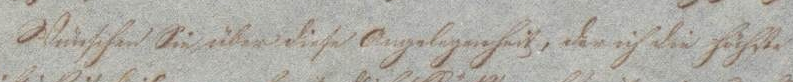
Wünschen Sie über diese Angelgenheit, der ich die höchste
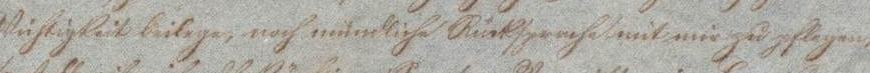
Wichtigkeit beilege, noch mündliche Rücksprache mit mir zu pflegen,
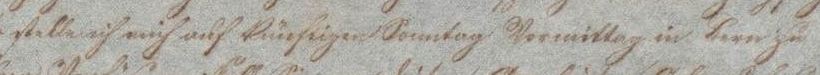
stelle ich mich auf künftigen Sonntag Vormittag in Bern zu
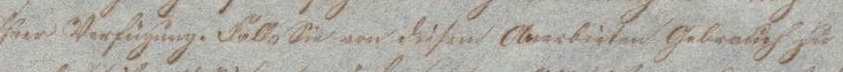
Ihrer Verfügung. Falls Sie von diesem Anerbieten Gebrauch zu
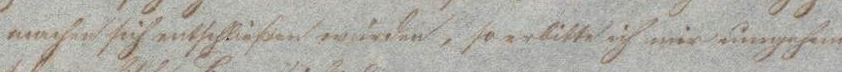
machen sich entschließen würden, so erbitte ich mir umgehende
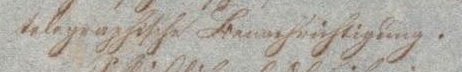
telegrafische Benachrichtigung.
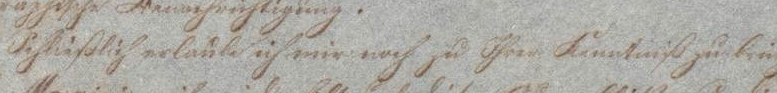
Schließlich erlaube ich mir noch zu Ihrer Kenntniß zu bringen,
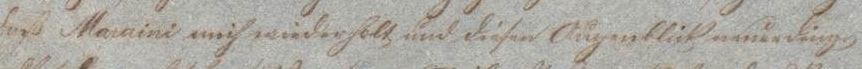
daß Maraini mich wiederholt und diesen Augenblick neuerdings
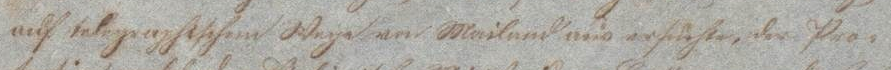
auf telegrafischem Wege von Mailand aus ersuchte, der Pro-
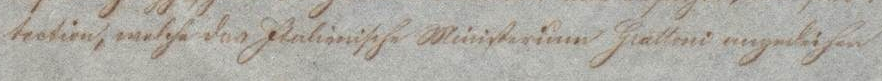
tection, welche das Italienische Ministerium Grattoni angedeihen
